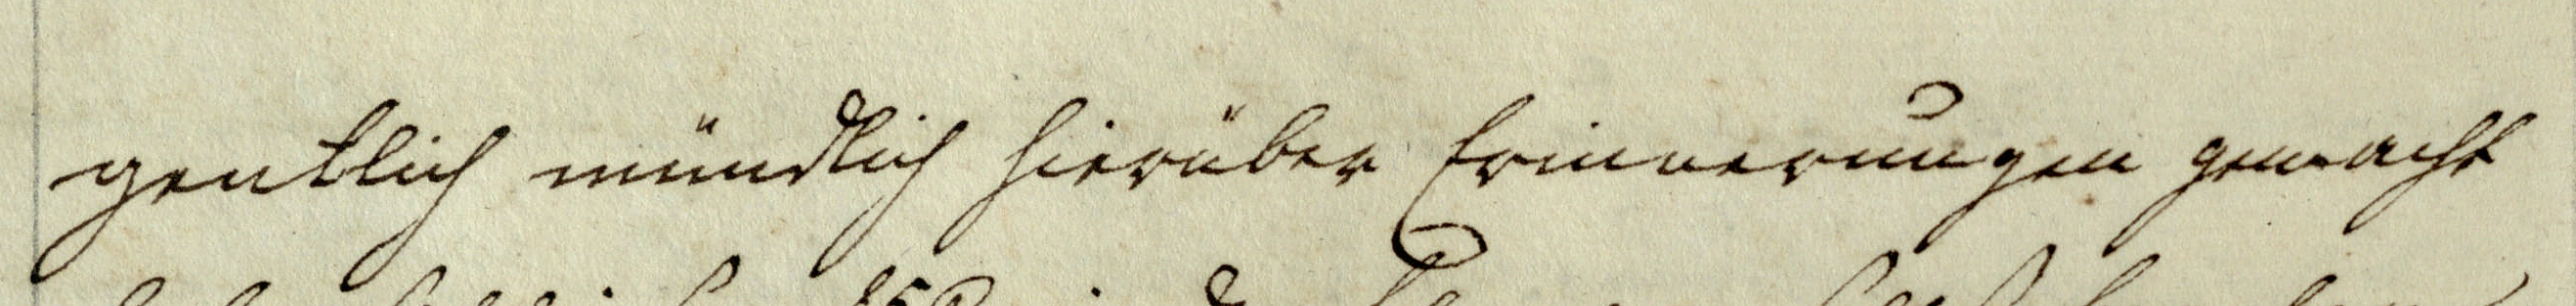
gentlich mündlich hierüber Erinnerungen gemacht
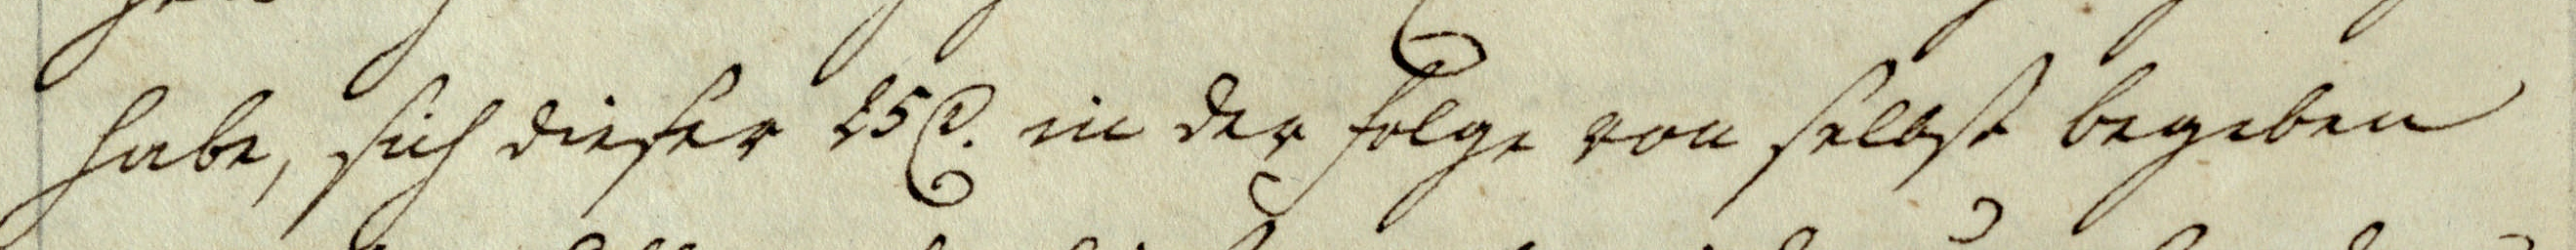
habe, sich dieser 25 l. in der Folge von selbst begeben
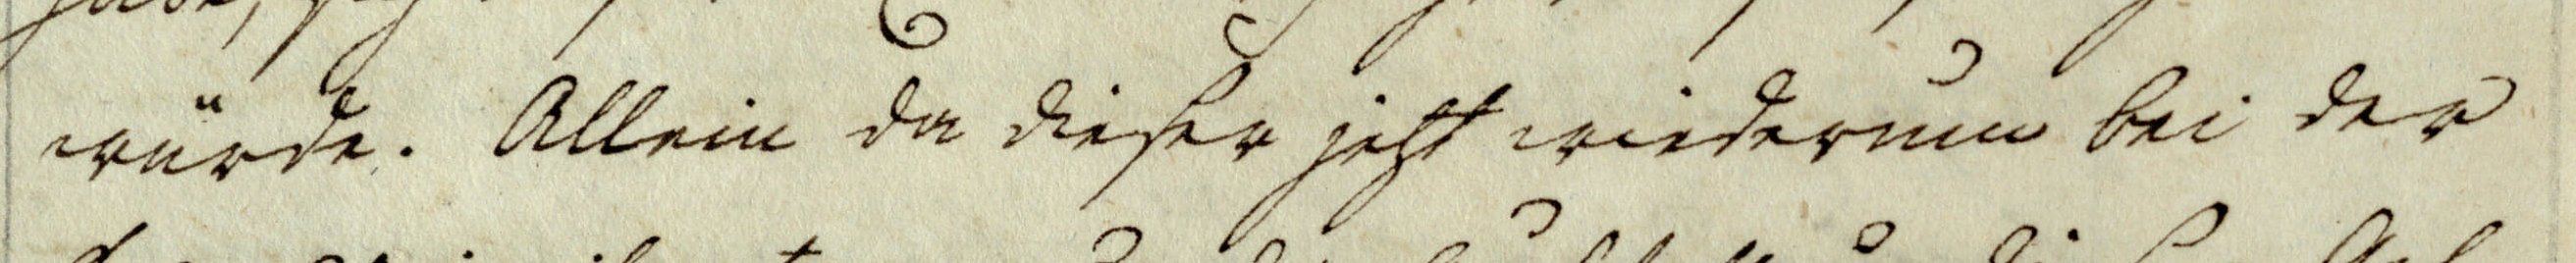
würde. Allein da dieser jetzt wiederum bei der
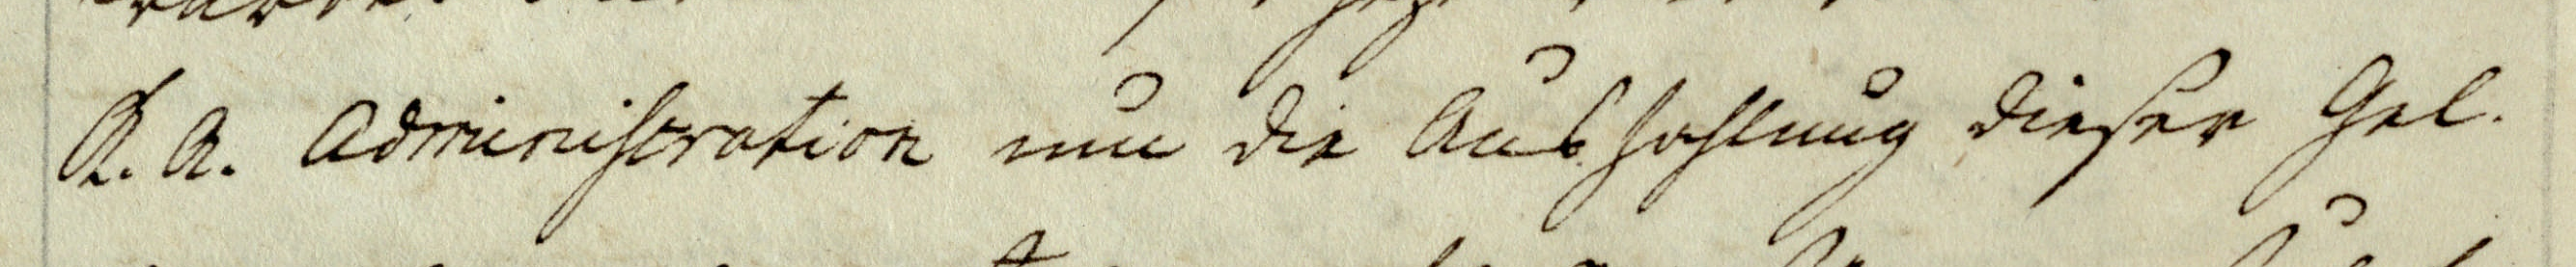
K. A. Administration um die Auszahlung dieser Gel¬
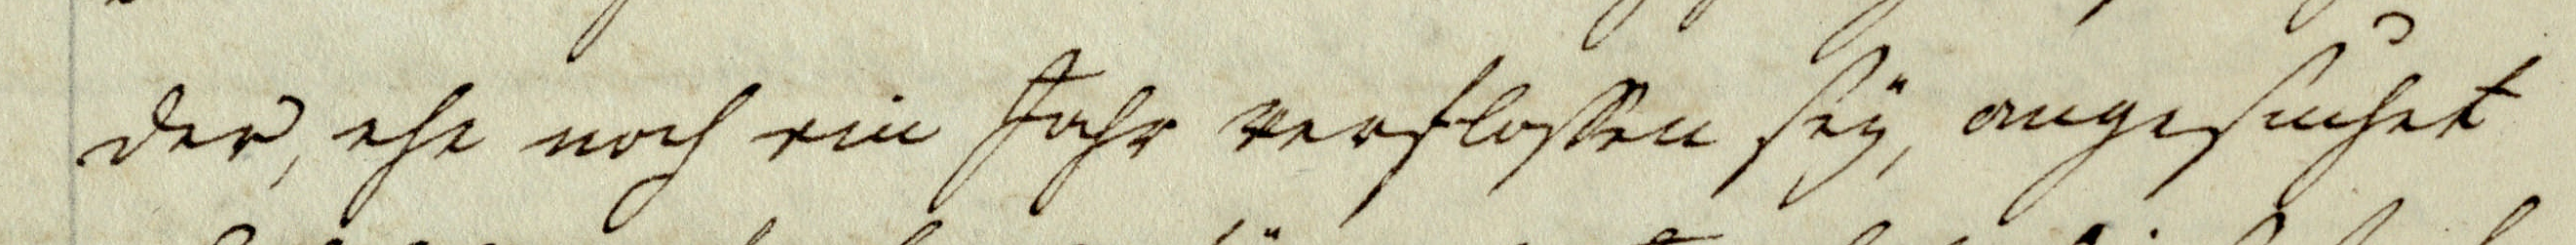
der, ehe noch ein Jahr verflossen seÿ, angesuchet
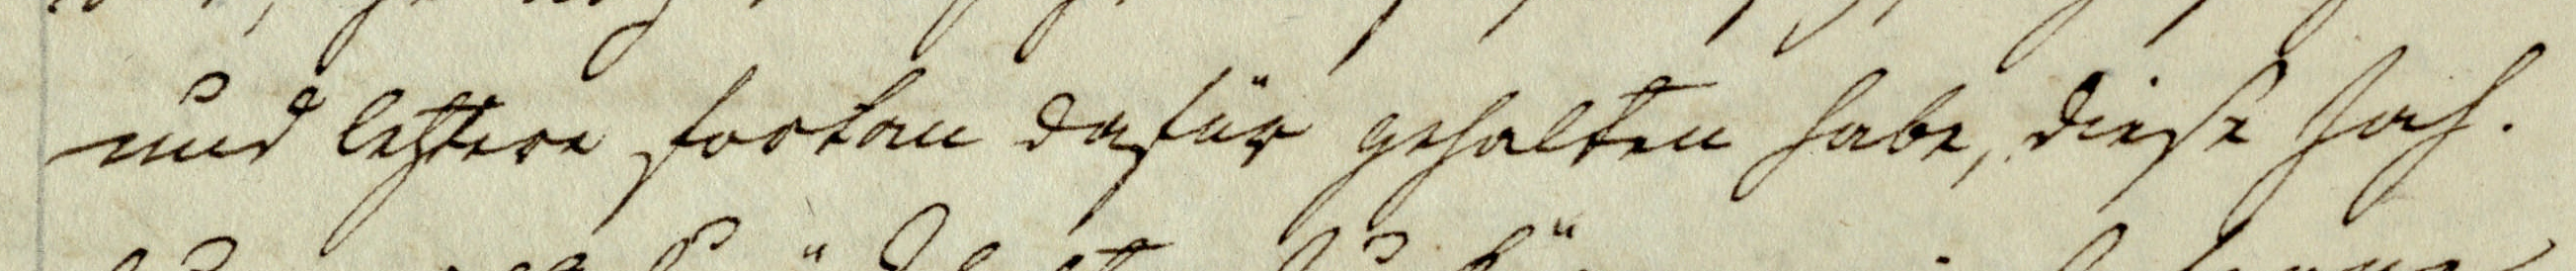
und letztere fortan dafür gehalten habe, diese Zah¬
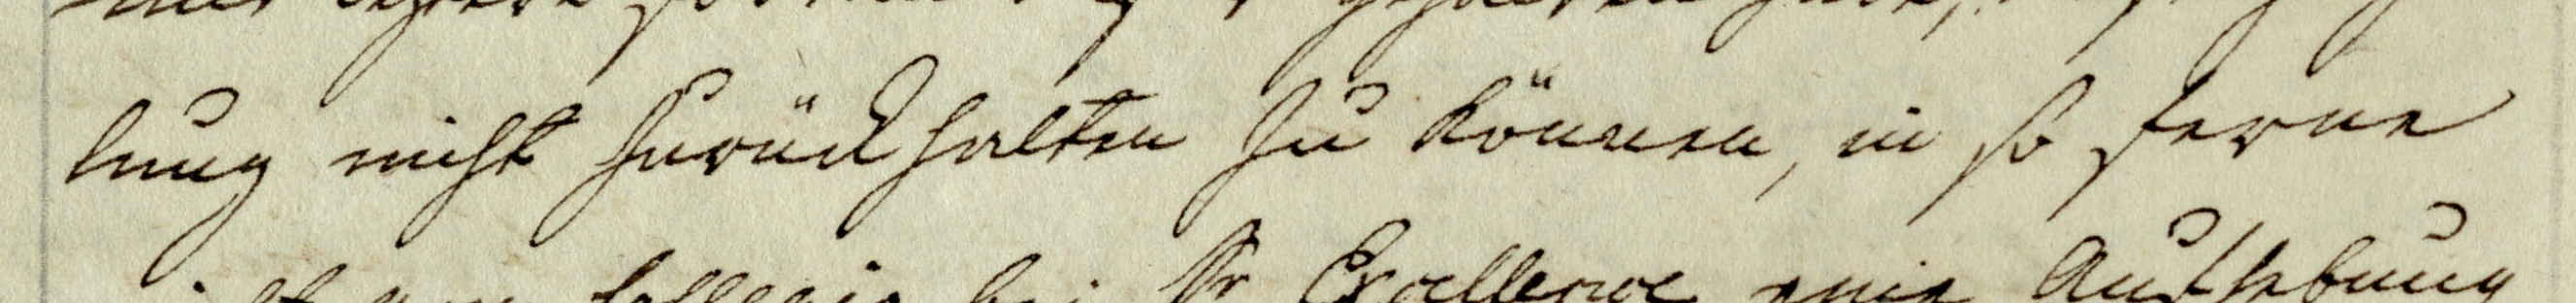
lung nicht zurückhalten zu können, in so ferne
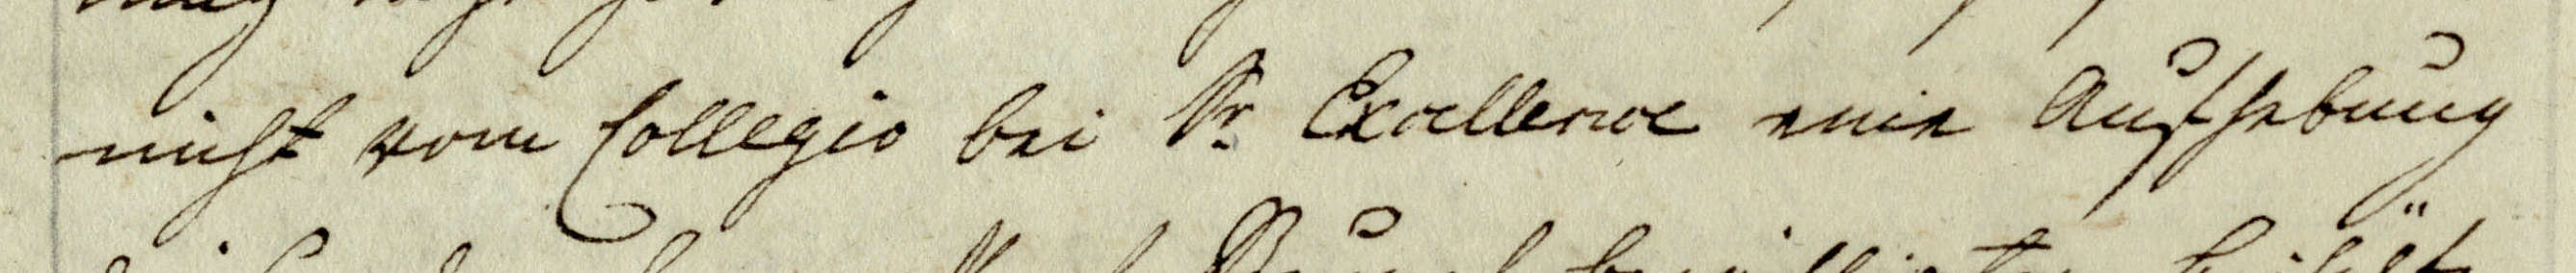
nicht vom Collegio bei Sr Excellence eine Aufhebung
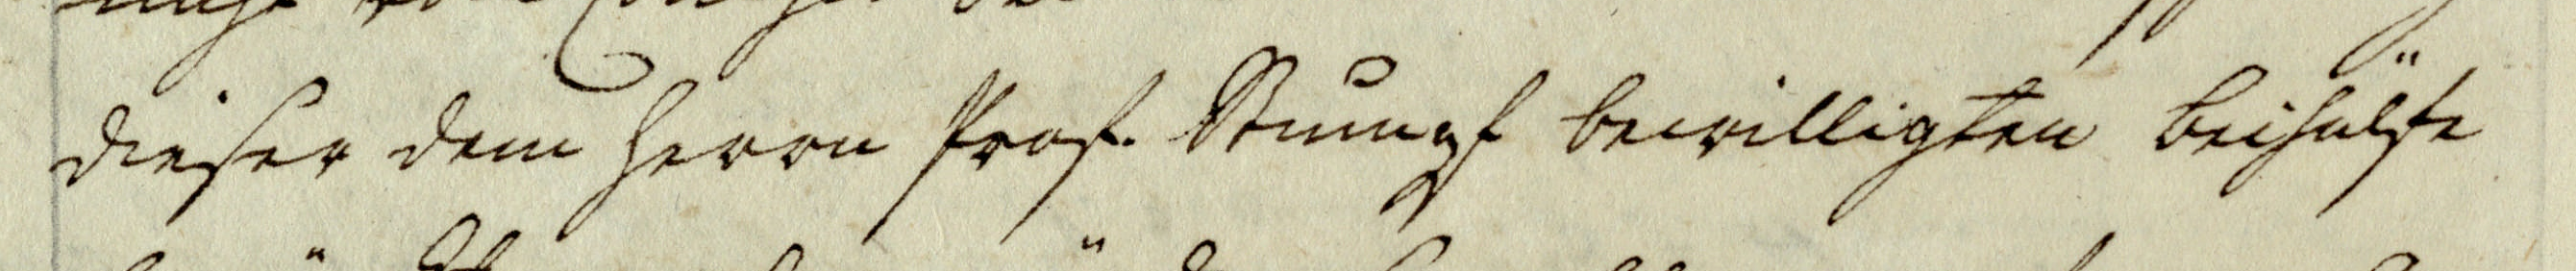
dieser dem Herrn Prof. Stumpf bewilligten Beihülfe
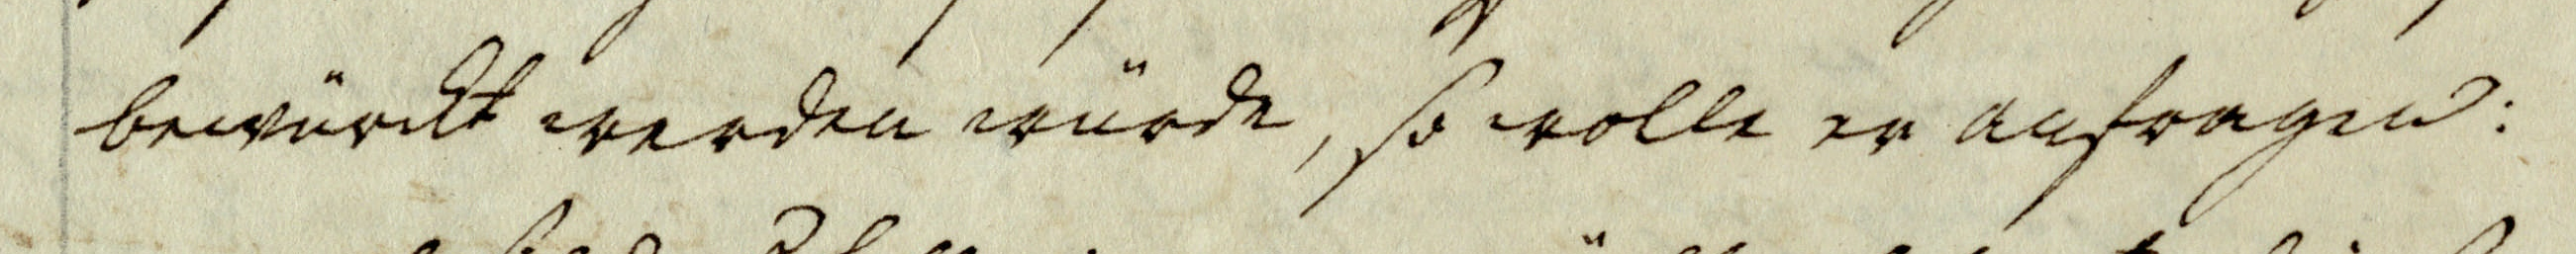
bewürckt werden würde, so wolle er anfragen:
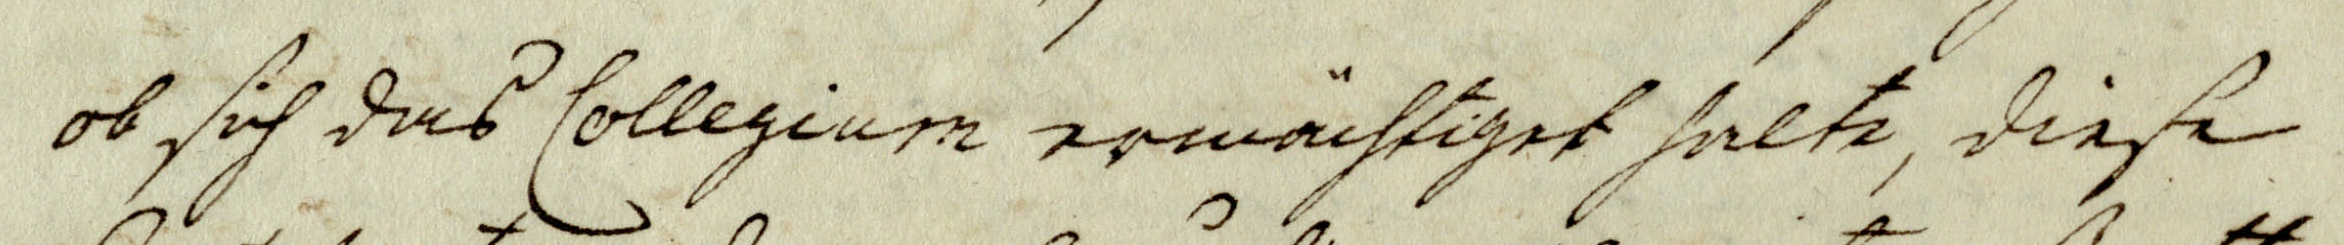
ob sich das Collegium ermächtiget halte, diese
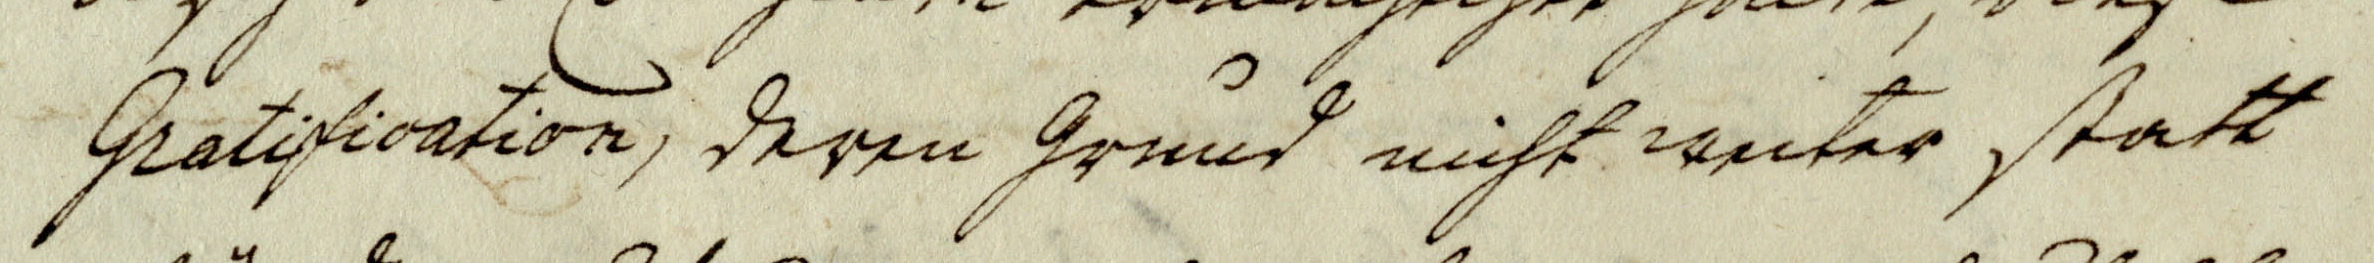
Gratification, deren Grund nicht weiter statt
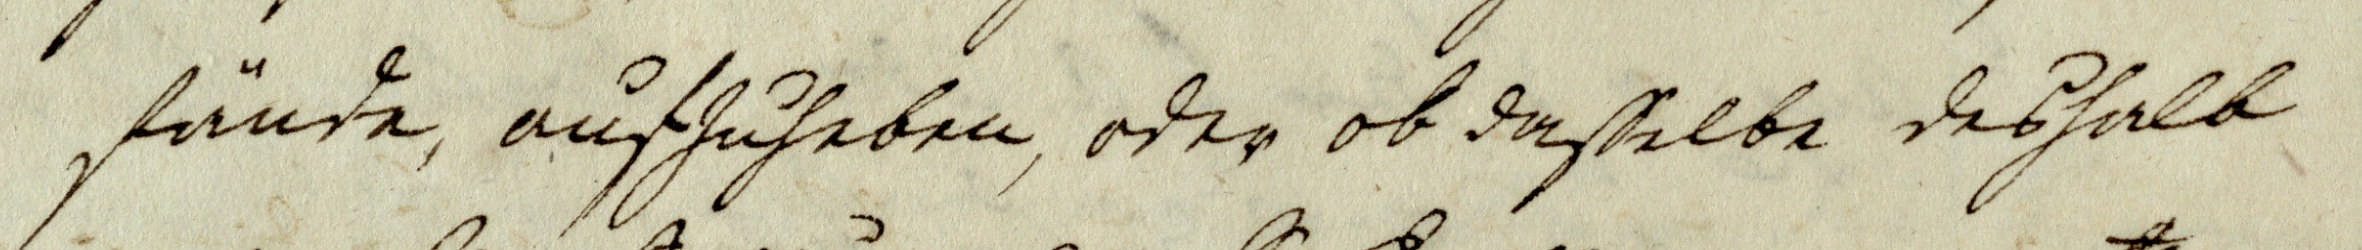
fände, aufzuheben, oder ob dasselbe deshalb
